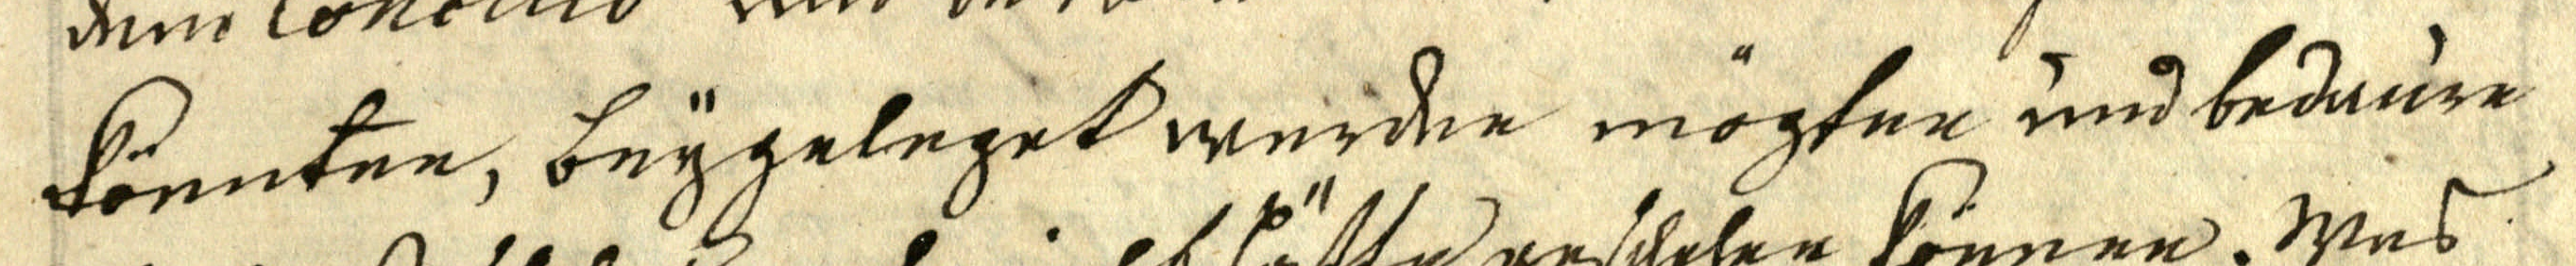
könnten, beÿgeleget werden mögten und bedaure
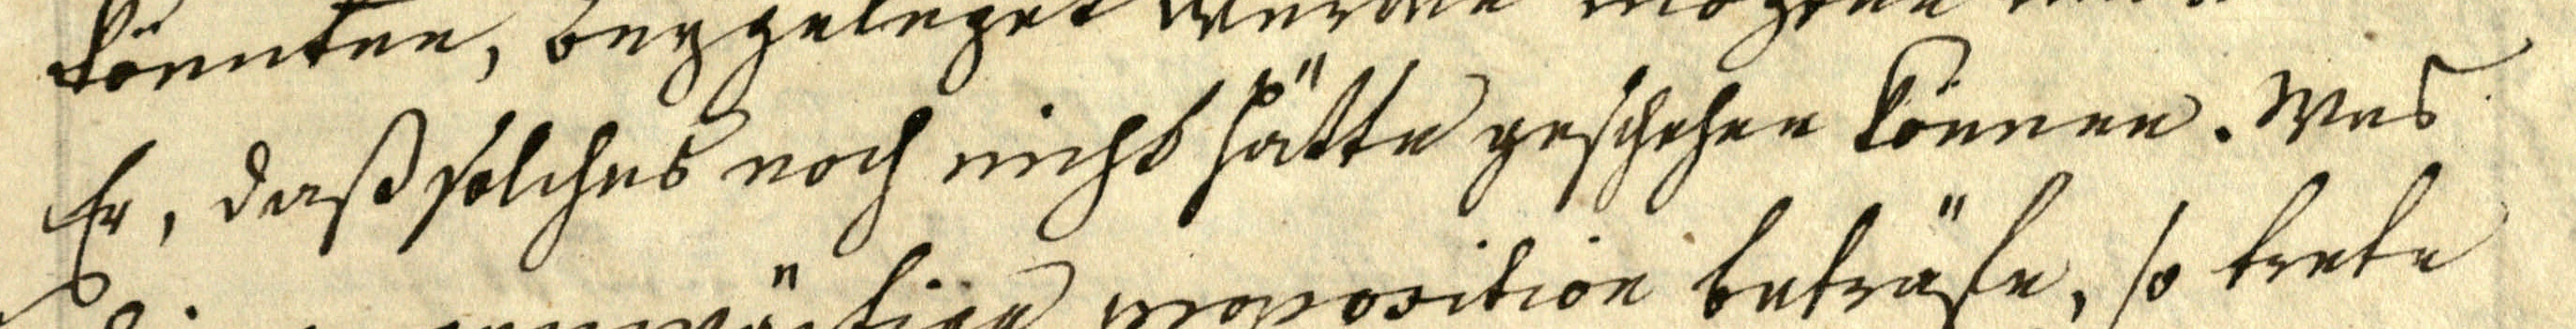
Er, daß solches noch nicht hätte geschehen können. Was
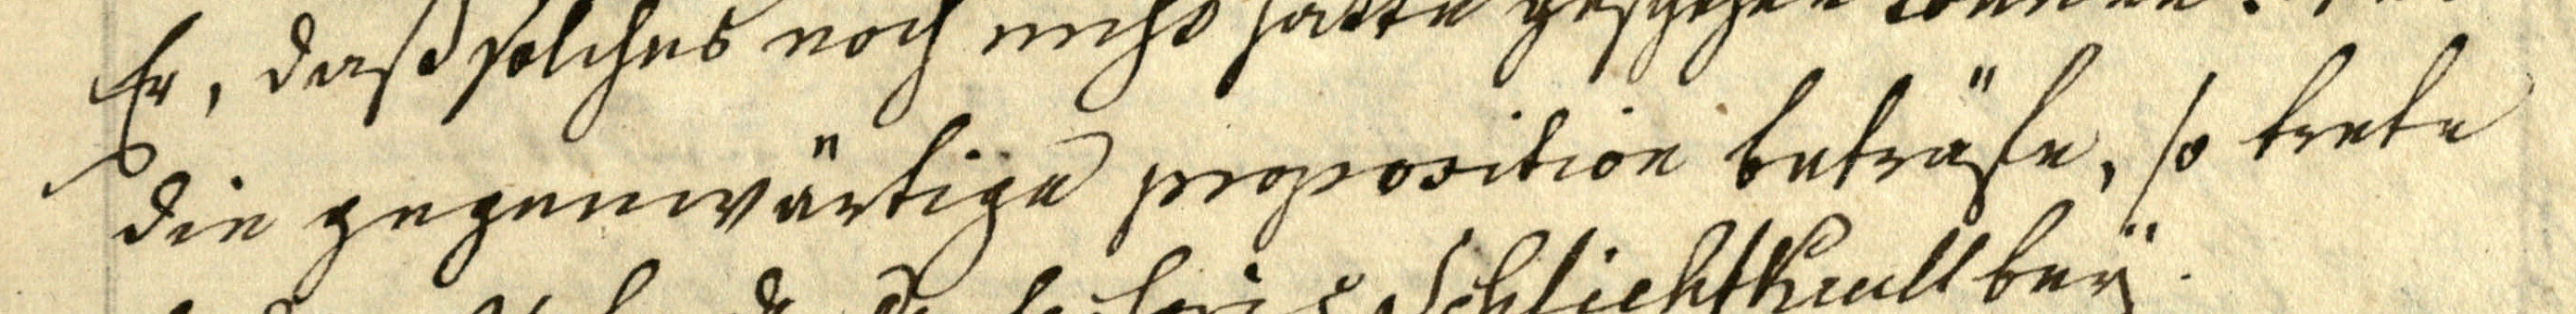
die gegenwärtige proposition beträfe, so trete
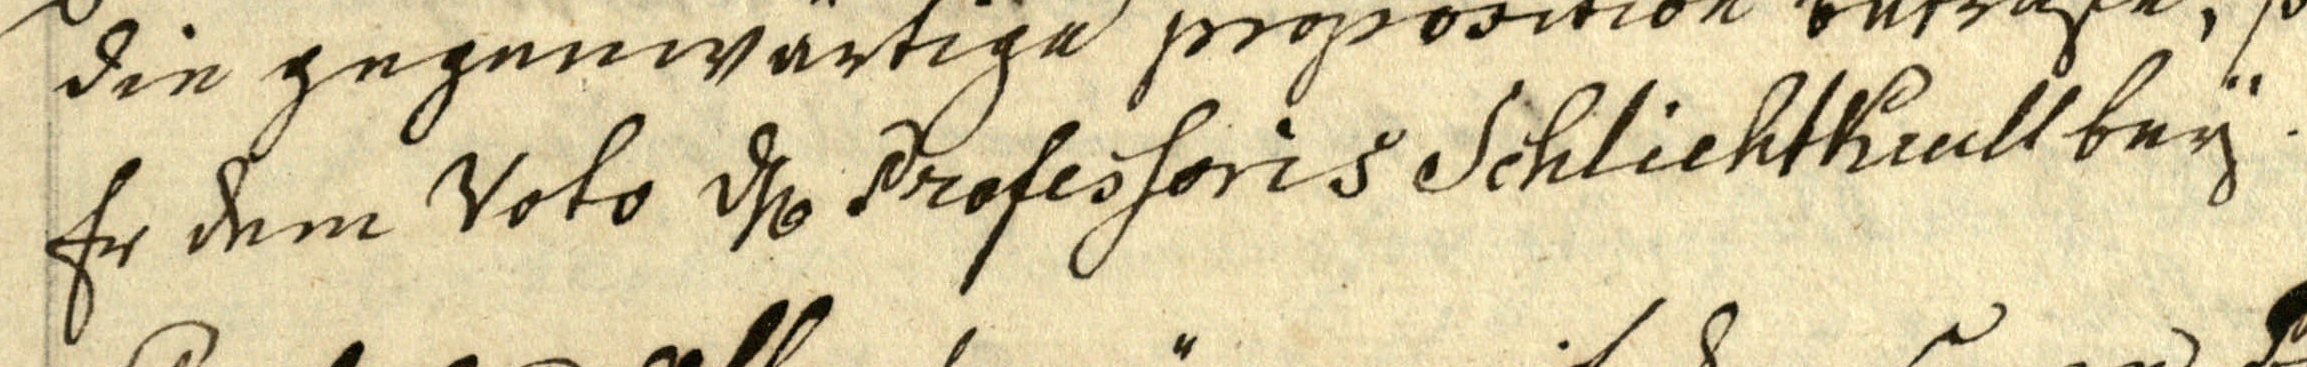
Er dem Voto dh Professoris Schlichtkrull beÿ.
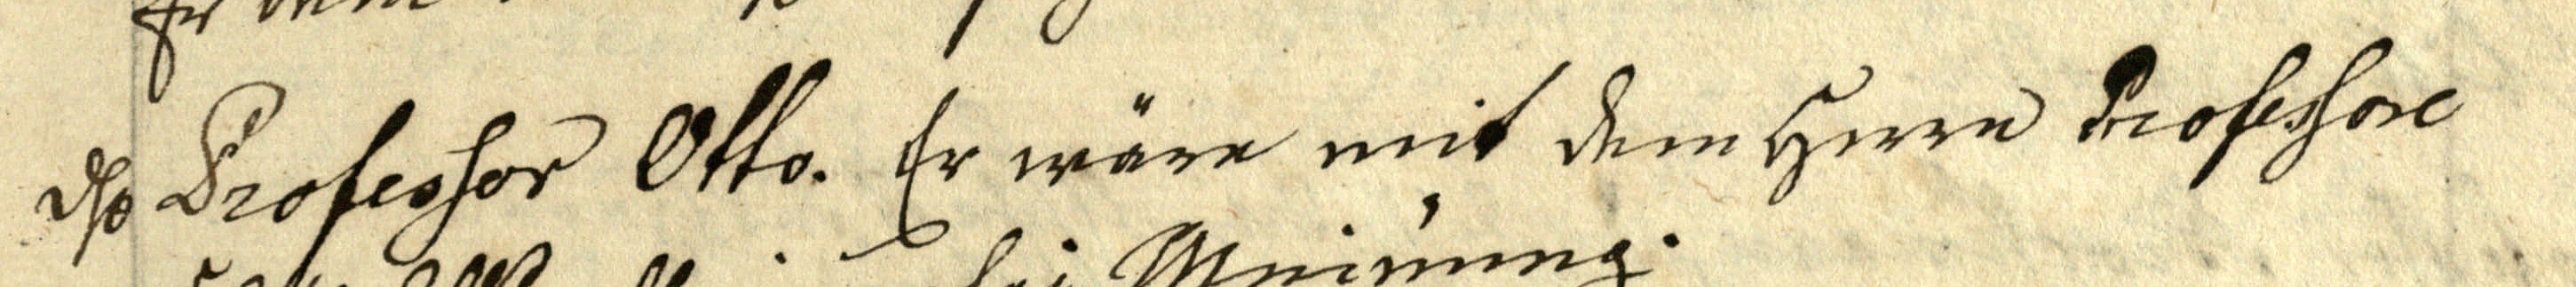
dh Professor Otto. Er wäre mit dem Herrn Professore
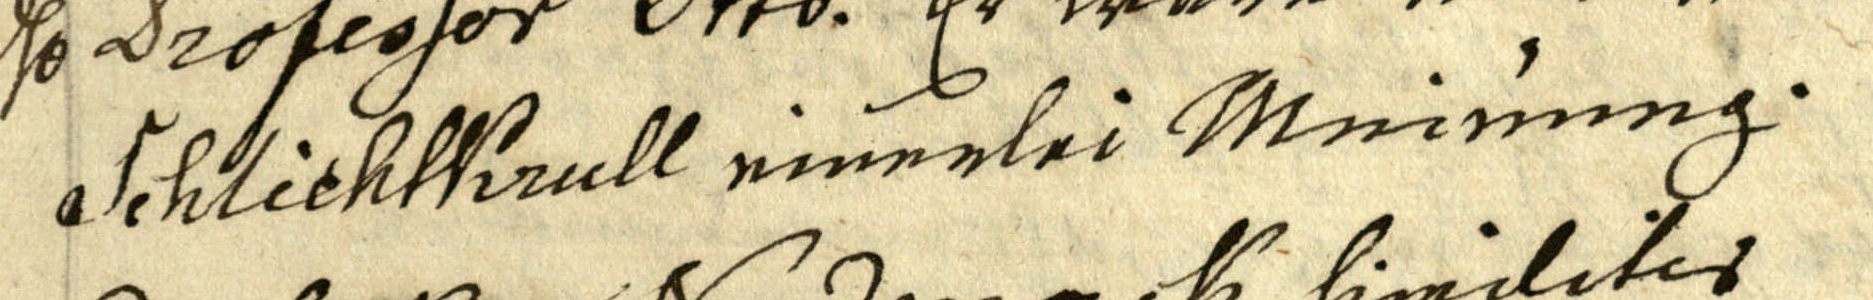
Schlichtkrull einerlei Meinung.
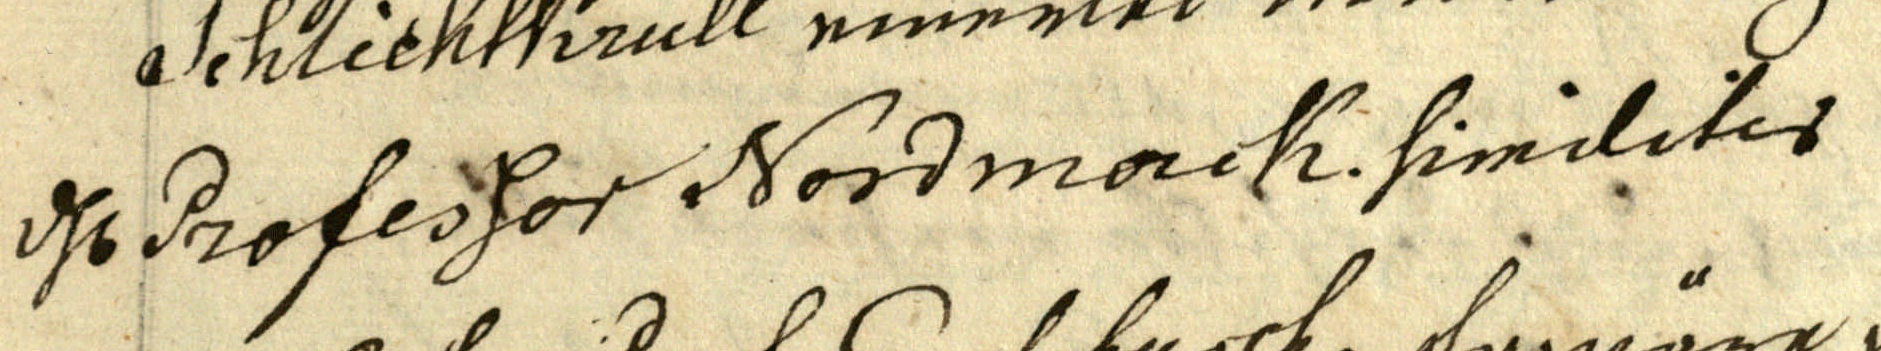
dh Professor Nordmarck similiter.
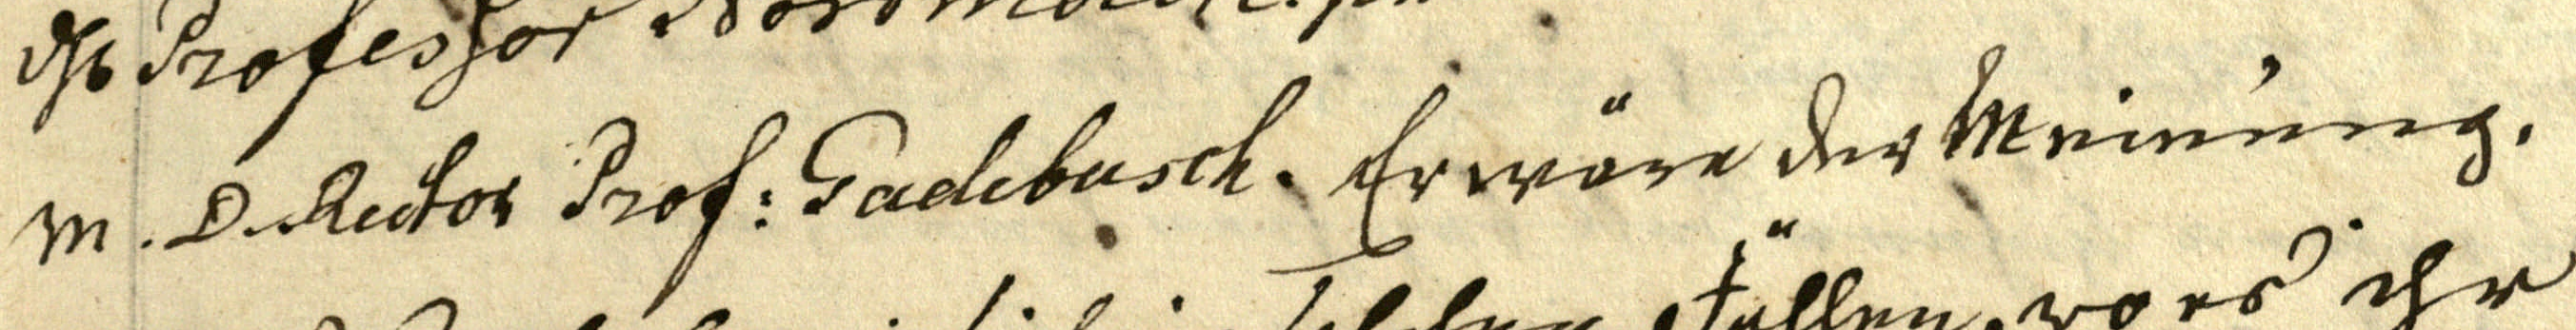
M. D. Rector Prof. Gadebusch. Er wäre der Meinung,
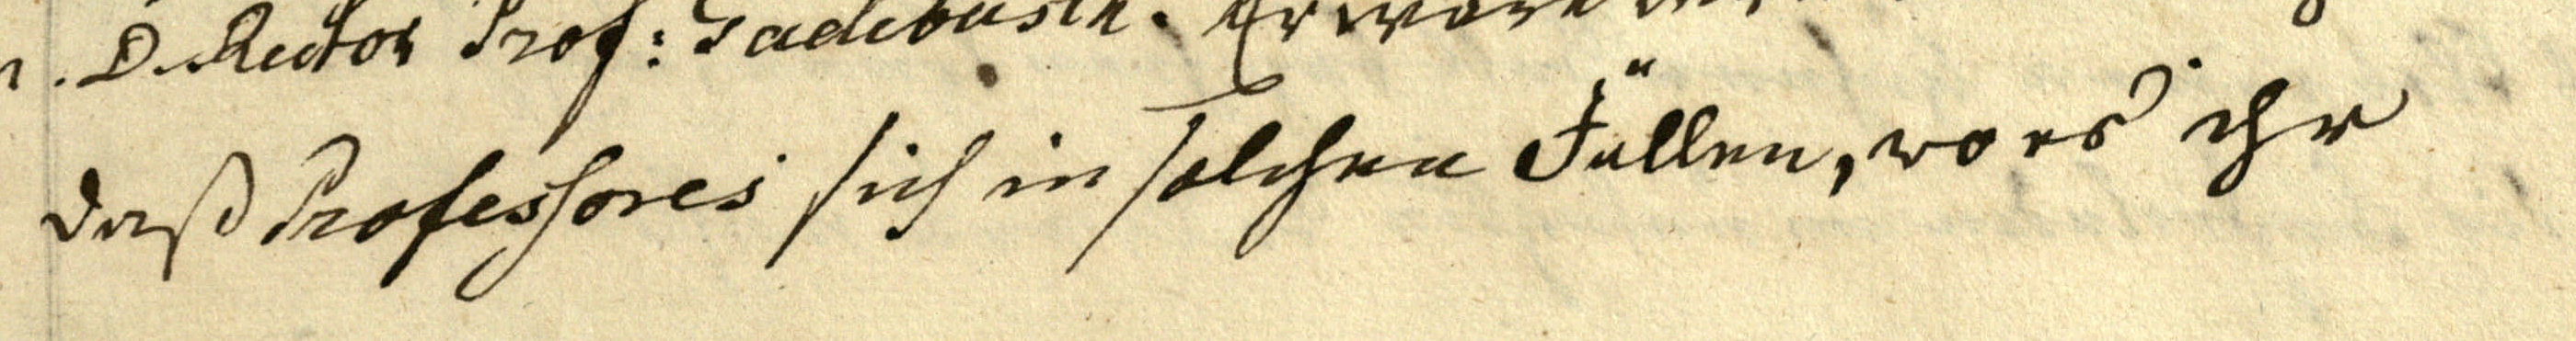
daß Professores sich in solchen Fällen, wo es ihr
